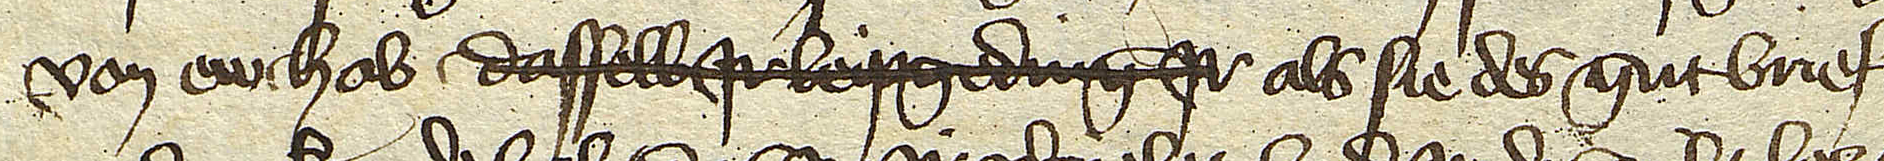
von ew / hab / daſſelb Ir leipgeding Ir als ſie des gut brief
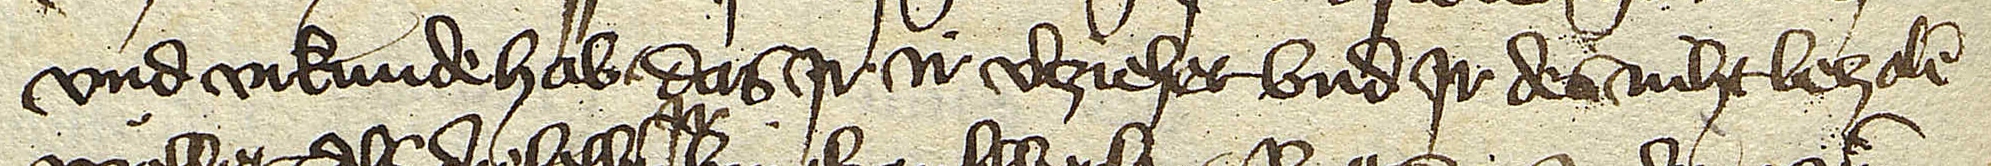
vnd vrkunde hab / das Ir ir v*cʒiehet vnd Ir des niht becʒale*
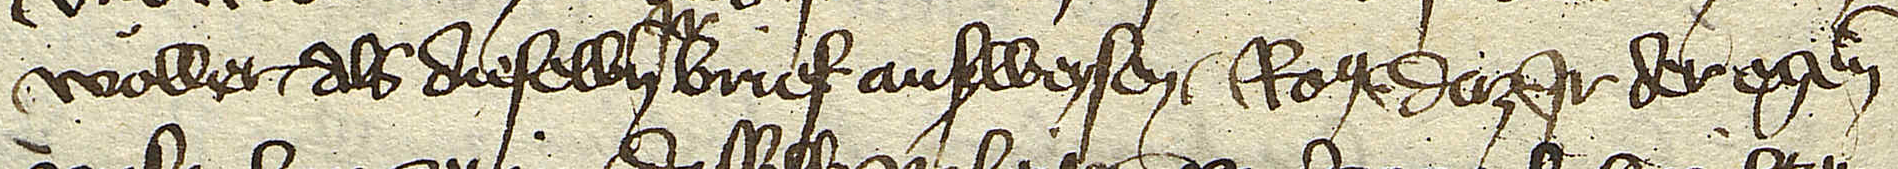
wöllet / Als dieſelbn* brief auſʒweyſen / Ro* / daʒ Ir der egen*
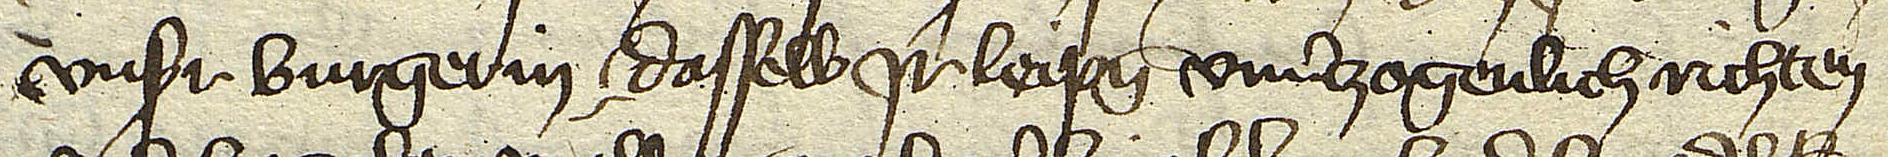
vnſ*r burgerin / daſſelb Ir leipg* vnu*cʒogenlich richten
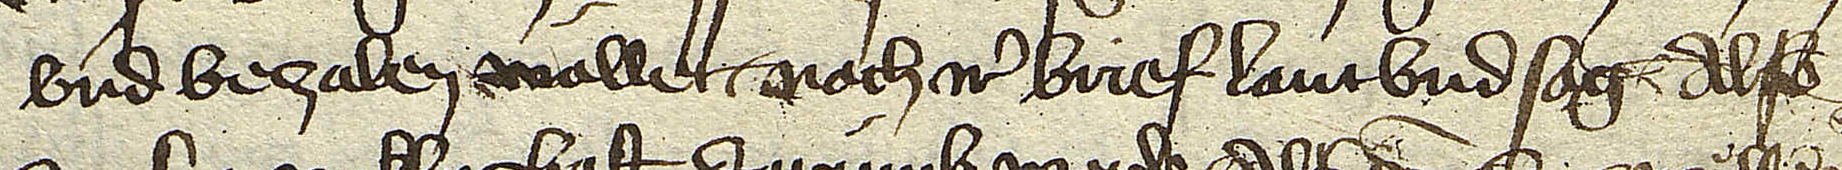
vnd becʒalen wöllet / nach ir* brief laut vnd ſag / Alſo
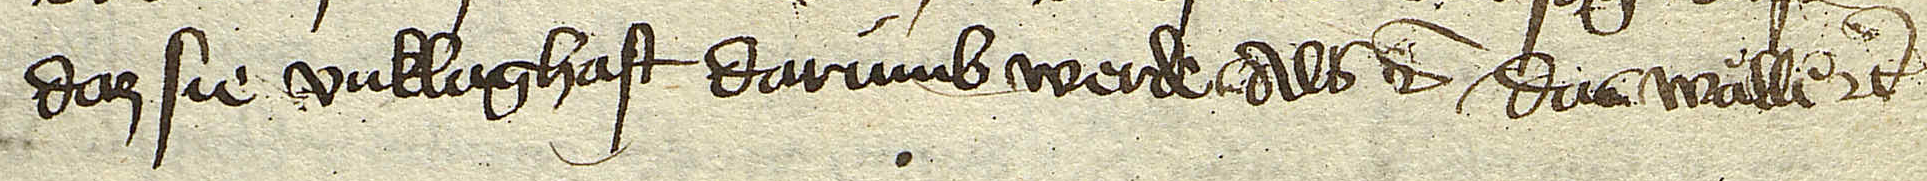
daʒ ſie vnklaghaft darümb werde / Als ec* das wölle* ec*
